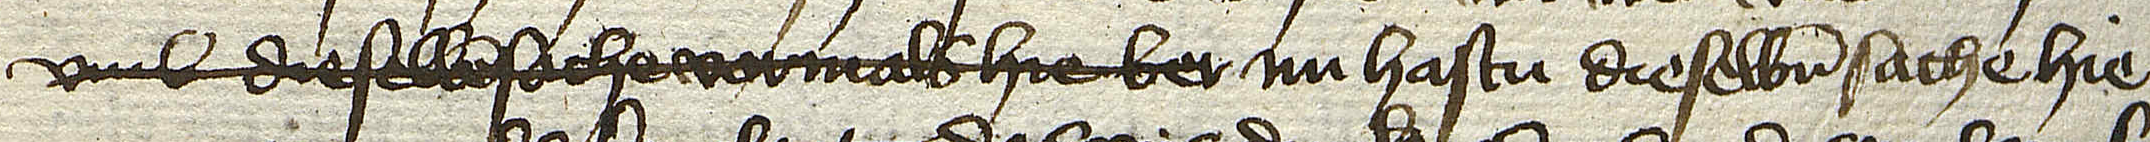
vmb dieſelbe* ſache vormals hie bei nu haſtu dieſelb*n ſache hie
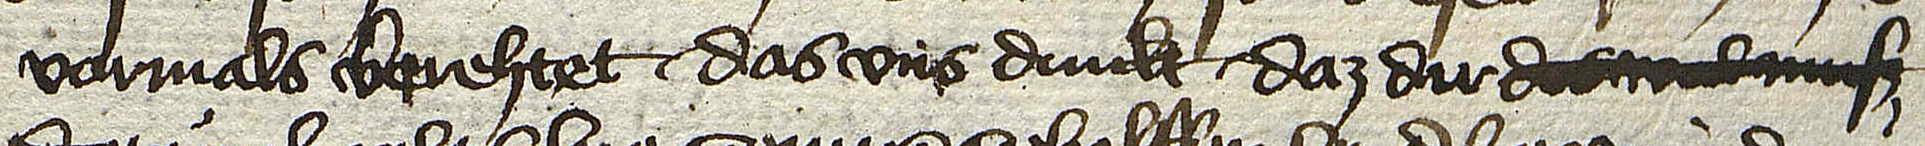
vormals v*erehtet / das vns dunkt / daʒ du das wol muſʒ
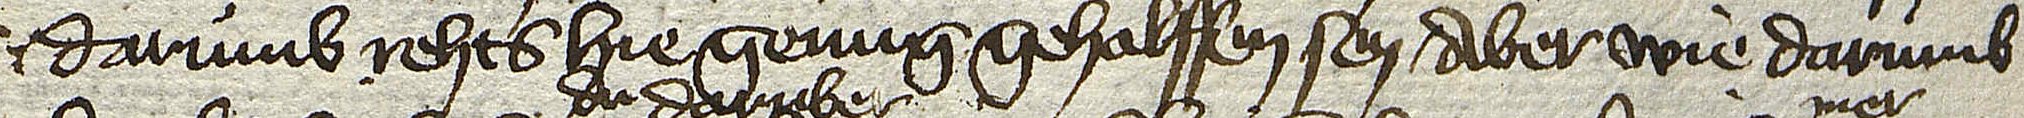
darümb rehts hie genug geholffen ſey / Aber wie darümb
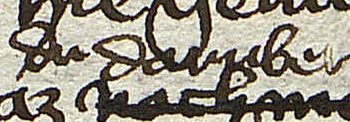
du daruber
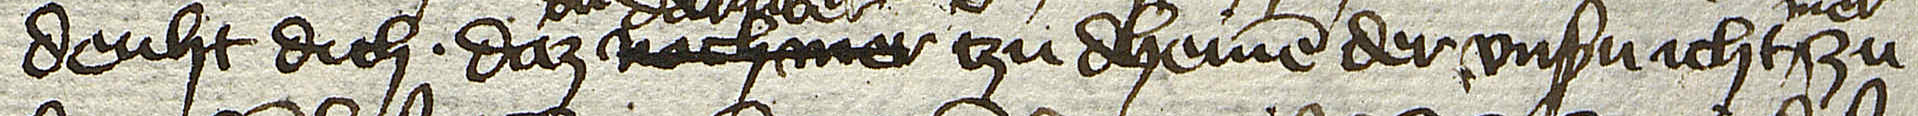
deuht dich . daʒ noch mer cʒu dheine* der vnſ*n icht ʒu
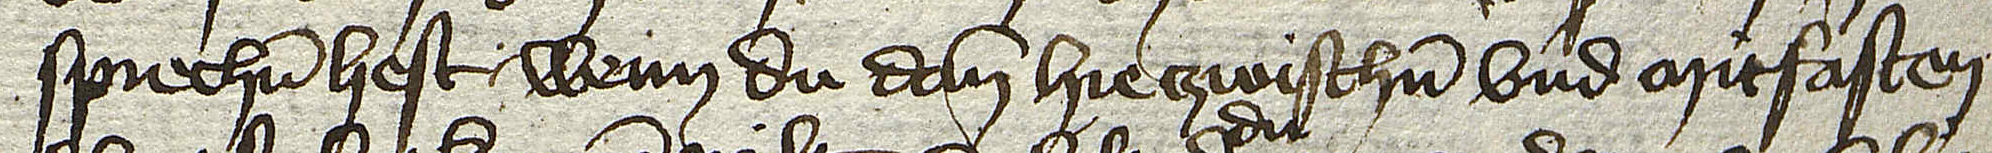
ſprech*n heſt / wenn du dan* hiecʒwiſch*n vnd Mitfaſten
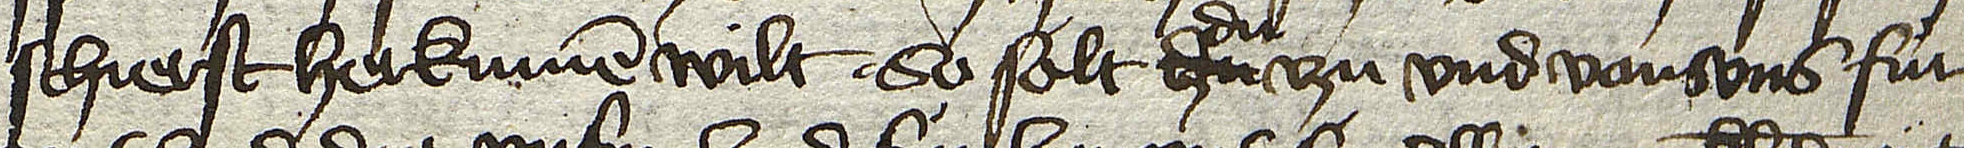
ſchierſt herkume* wilt . So ſolt cʒu cʒu vnd von vns für
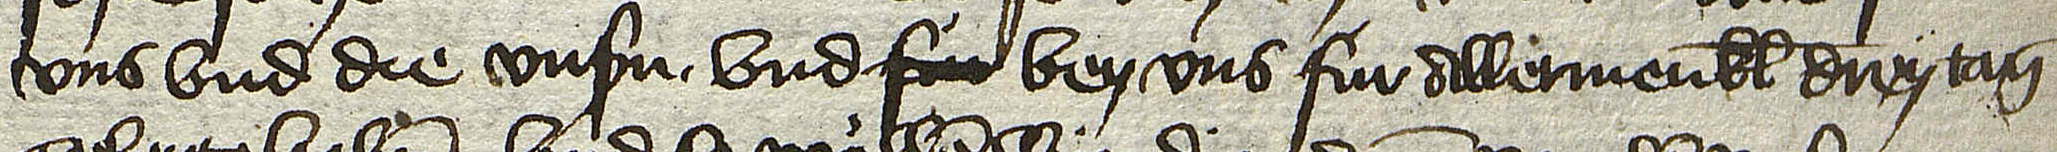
vns vnd die vnſ*n . Vnd für bey vns für Allermenkl* drey tag
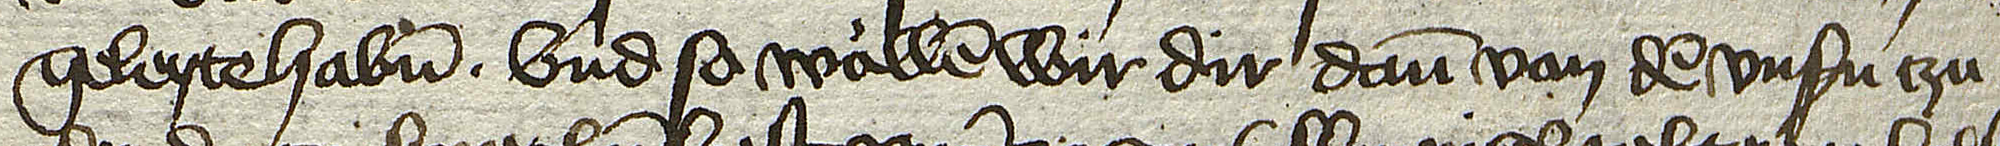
geleyte hab*n . Vnd ſo wölle* wir dir dan* von de* vnſ*n cʒu
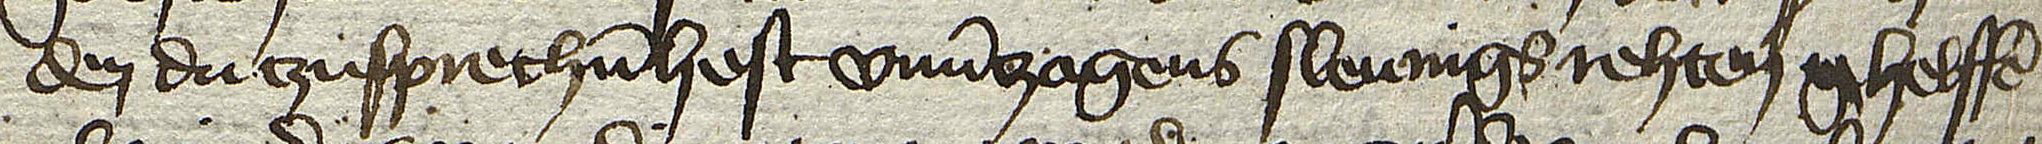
den du cʒuſprech*n haſt vnu*cʒogens ſleunigs rehten g helffe*
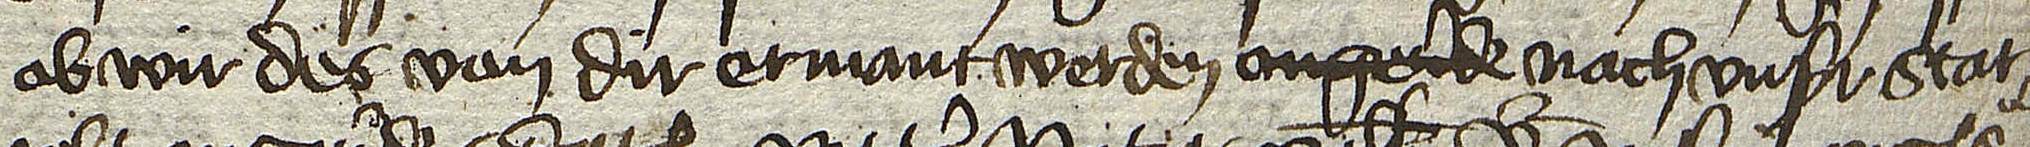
ob wir des von dir ermant werden ongeu*de nach vnſ*r Stat
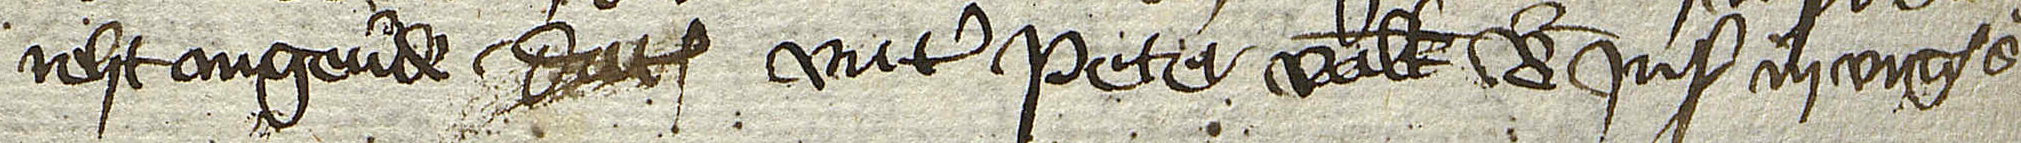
reht ongeu*de / dat* vnt* peter volk* B* Inſ* in vig* S*
